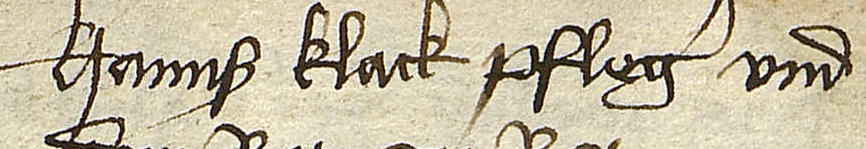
Hannſ* klack pfleg* vnd
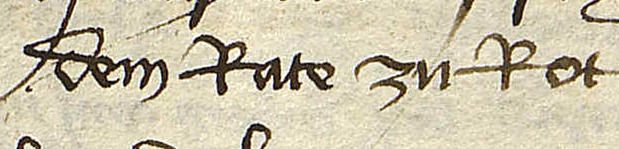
dem Rate ʒu Rot
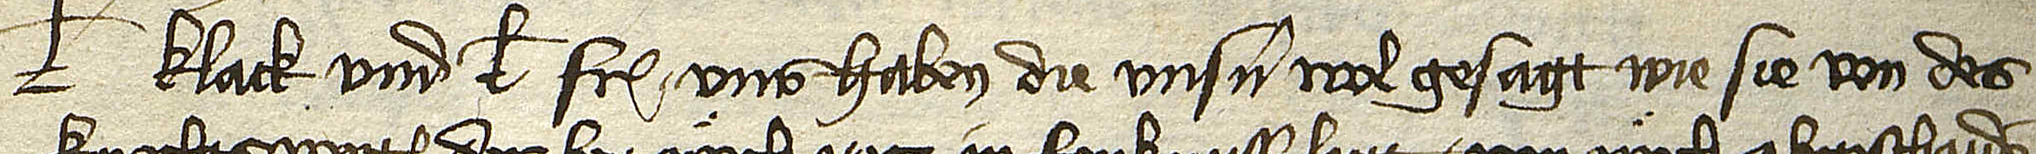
L* klack vnd l* fr* . vns haben die vnſ*n wol geſagt wie ſie von des
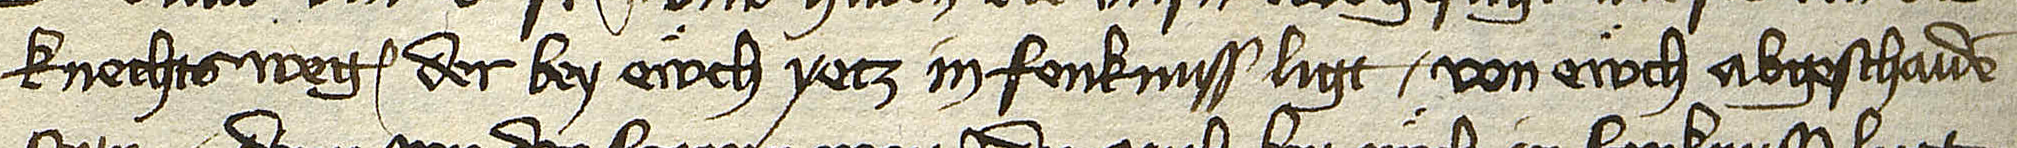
knechts weg* der bey ewch yecʒ in fenknuſſligt / von ewch abgeſchaide*
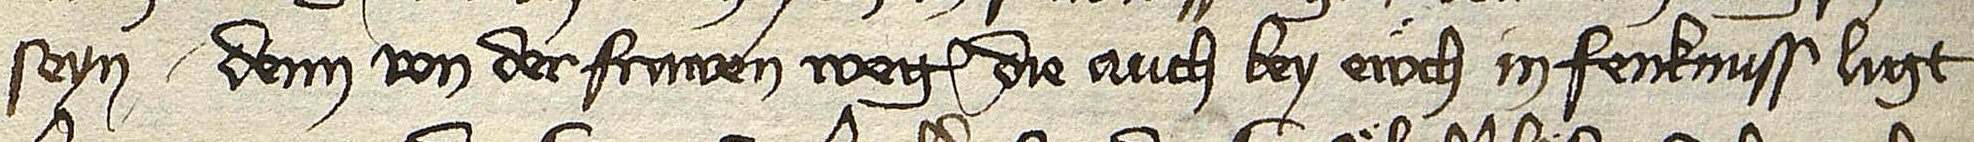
ſeyn / denn von der frawen weg* die auch bey ewch in fenknuſſ ligt
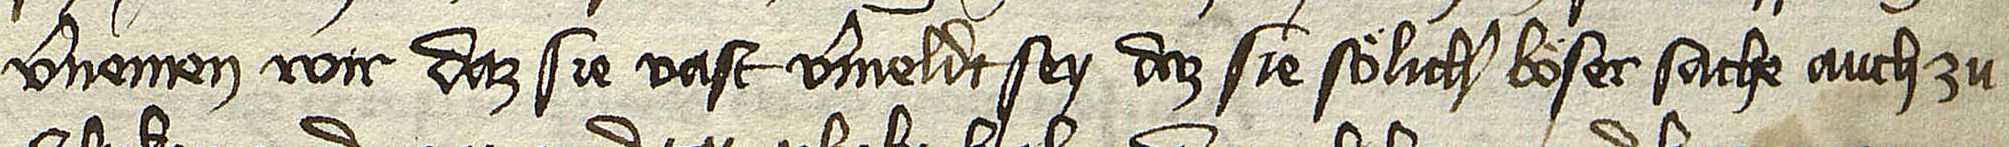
v*nemen wir daʒ ſie vaſt v*meldt ſey daʒ ſie ſölich* böſer ſache auch ʒu
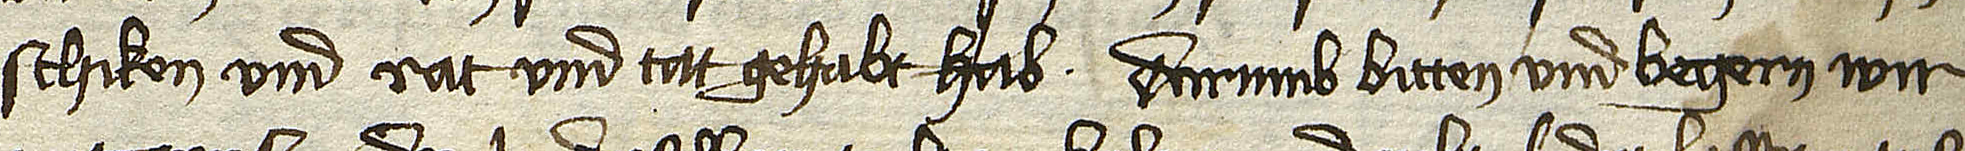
ſchiken vnd rat vnd tat gehabt hab . Darumb bitten vnd begern wir
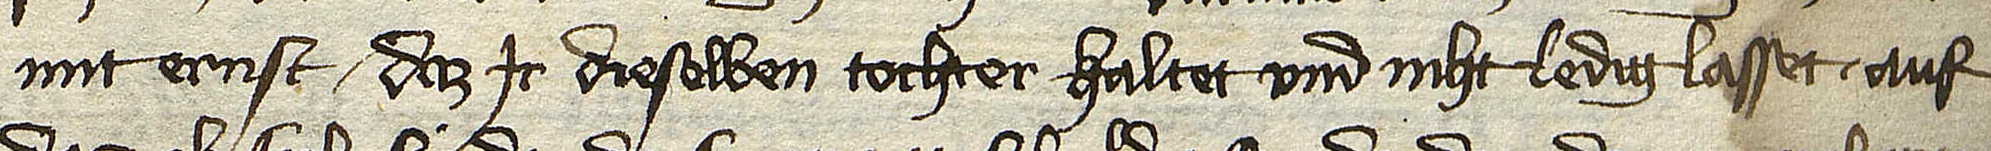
mit ernſt / Daʒ Ir dieſelben tochter haltet vnd niht ledig laſſet / auf
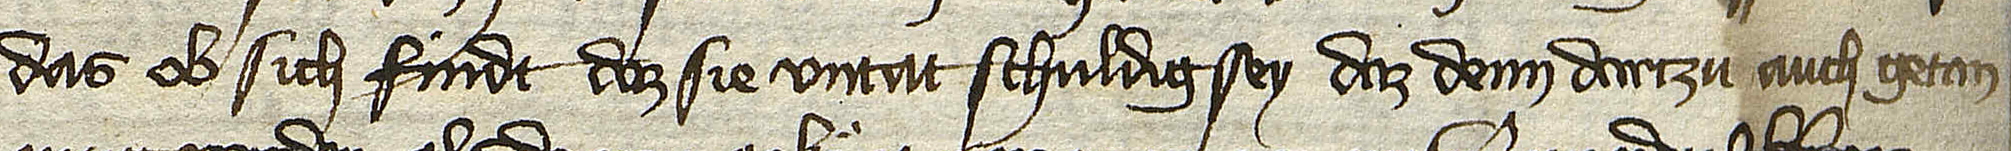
das ob ſich findt daʒ ſie vntat ſchuldig ſey daʒ denn darcʒu auch getan
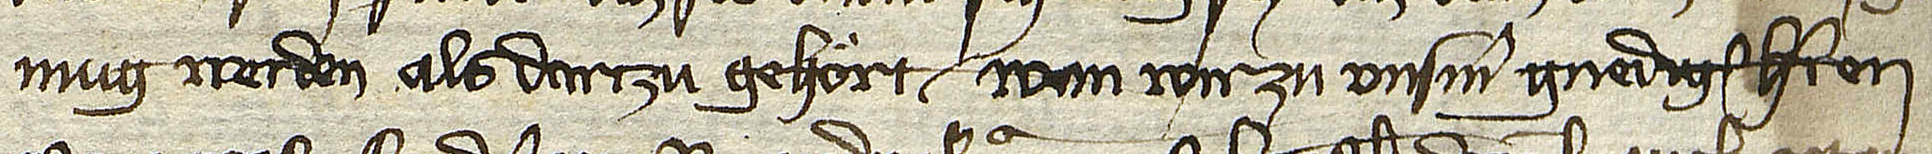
mug werden als darcʒu gehört / wan wir ʒu vnſ*m gnedig* h*ren
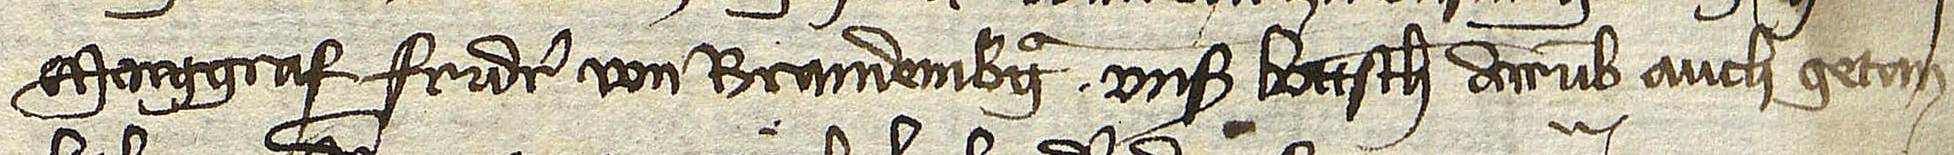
Marggraf Fridr* von Brandemb*g . vnſ* bottſch* daru*b auch getan
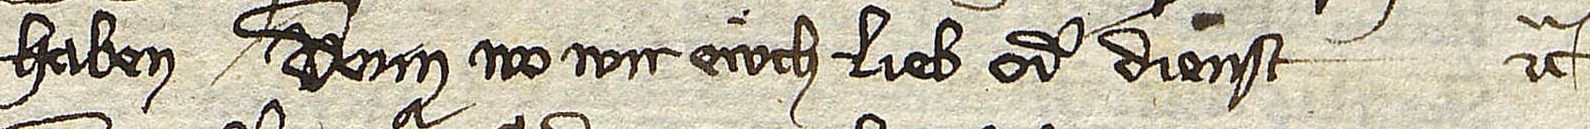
haben / Denn wo wir ewch lieb od* dienſt ec*
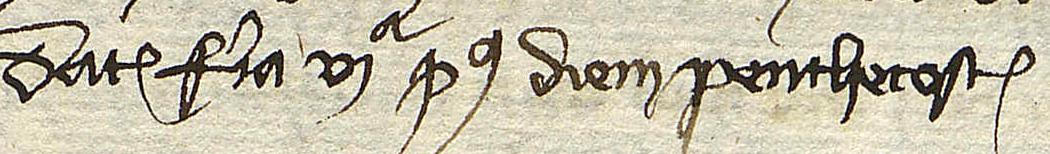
Dat* fia* vi* p* dien penthecoſt*
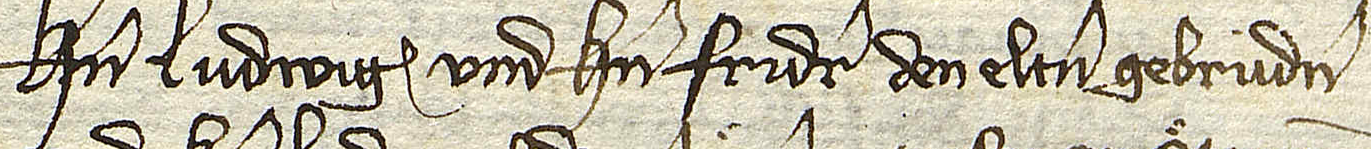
H*n ludwig* vnd H*n Fridr* den elt*n gebrüd*n
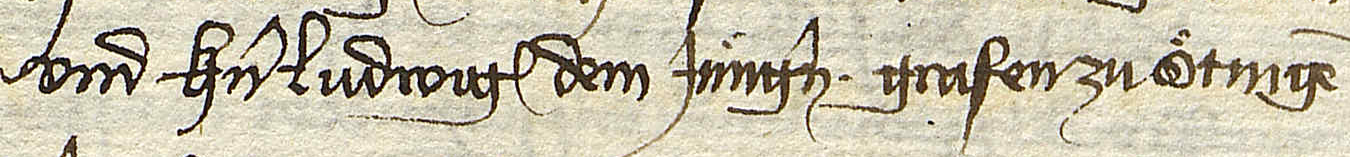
vnd H*n ludwig* dem Iüng*n . grafen ʒu Ötinge*
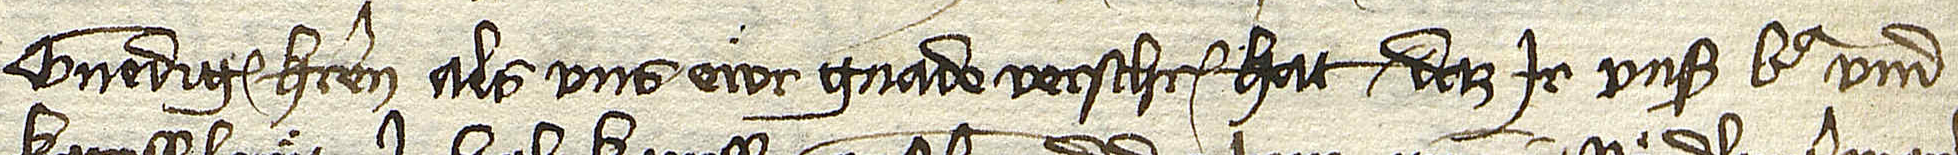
Gnedig* h*ren als vns ewr gnade verſchr* hat / daʒ Ir vnſ* b* vnd
